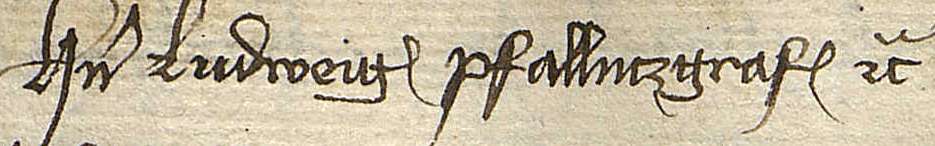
Hn* Ludweig* pfallncʒgraf* ec*
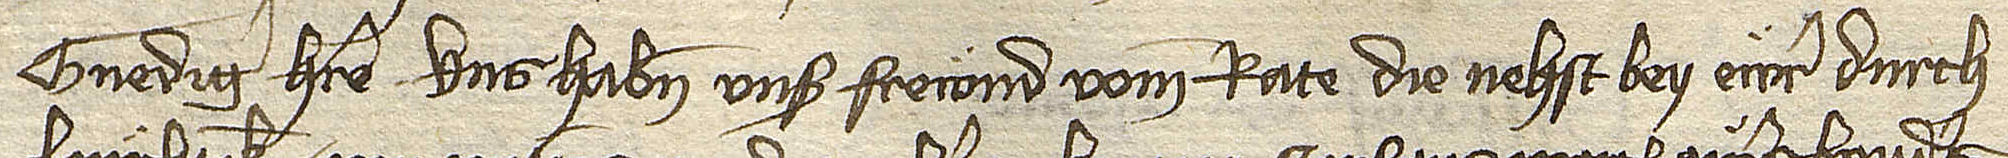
Gnedig* h*re / Vns habn* vnſ* freẅnd* vom* Rate die nehſt bey eẅr* durch
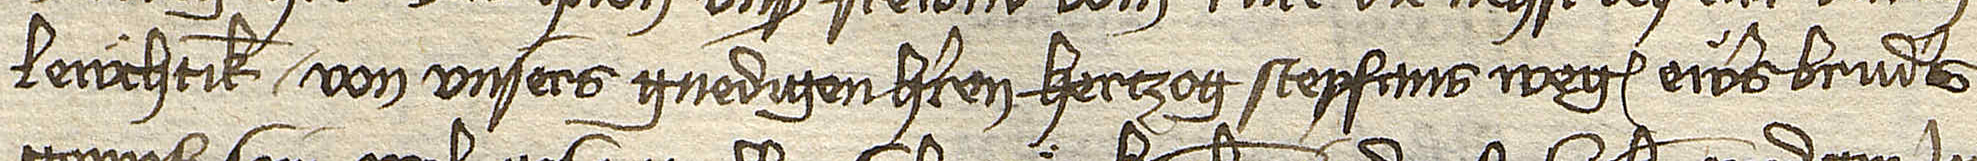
leẅchtik* / von vnſers gnedigen h*ren hercʒog ſtepfans weg* eẅr*s brud*s
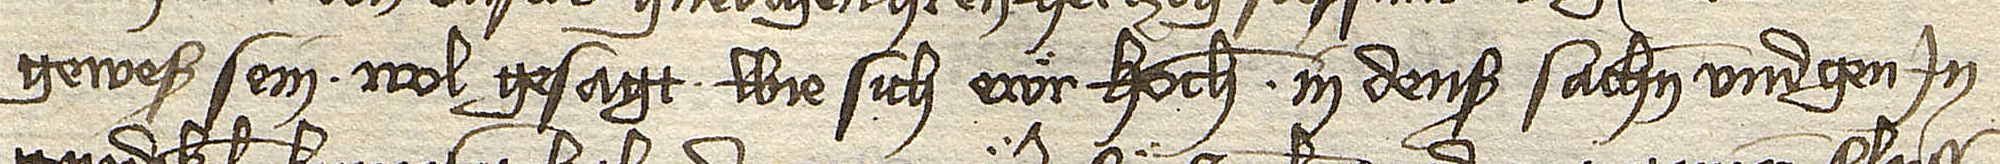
geweſ* ſein . wol geſagt . wie ſich eẅr Hoch* . in denſ* ſachn* vnd gen In
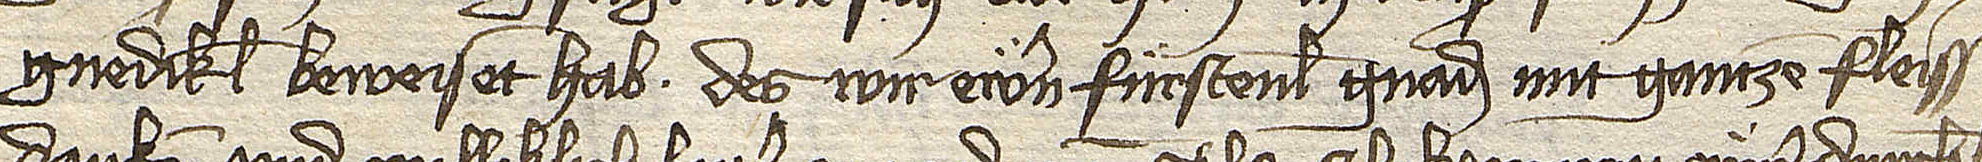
gnedikl* beweiſet hab . des wir eẅ*n fürſtenl* gnad* mit gancʒe* fleiſſ
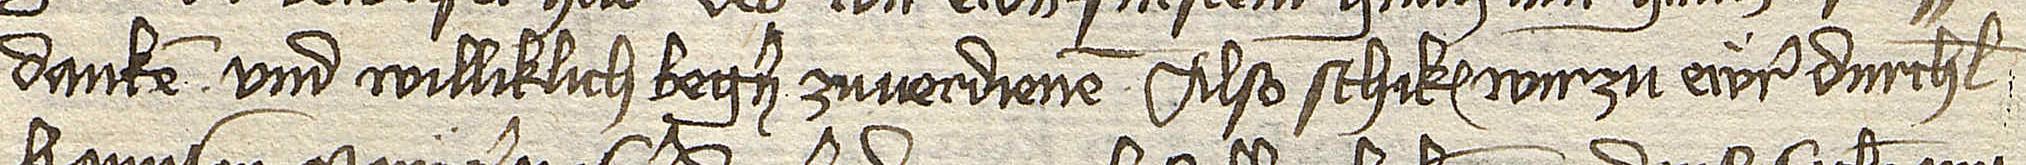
danke* . vnd williklich beg*n ʒuuerdiene* . Alſo ſchik* wir ʒu eẅr* durchl*
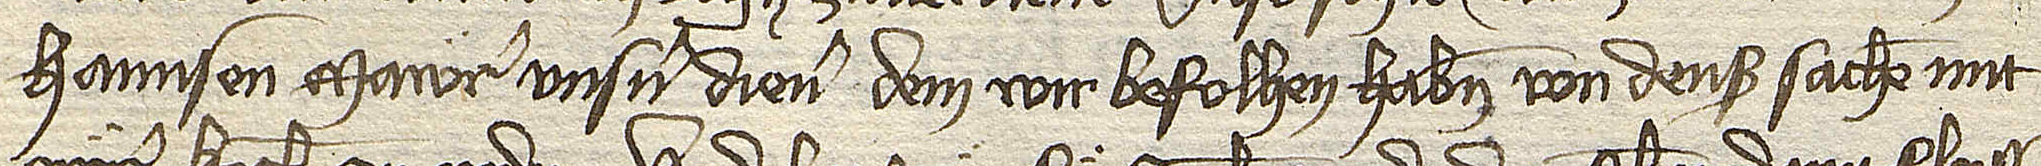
Hannſen Maẅr* vnſn* dien* . dem wir befolhen habn* von denſ* ſache* mit
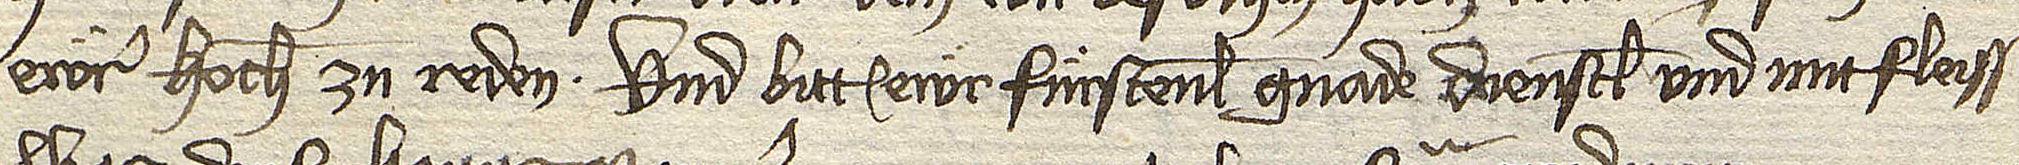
eẅr* Hoch* ʒu reden . Vnd bitt* eẅr fürſtenl* gnade dienſtl* vnd mit fleiſſ
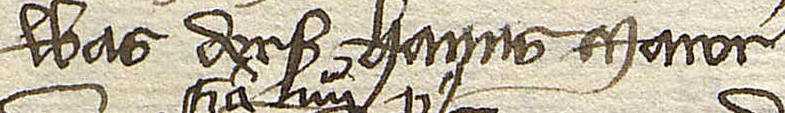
Was derſ* Hanns Mawr*
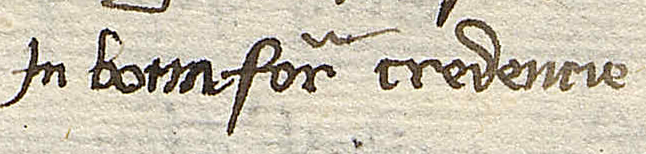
In bona for* credencie
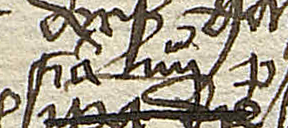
fia iiii* p*
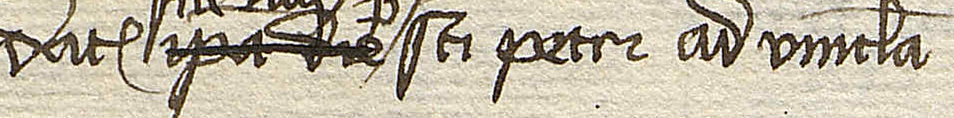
Dat* ipa* die ſci* petri ad vincla*
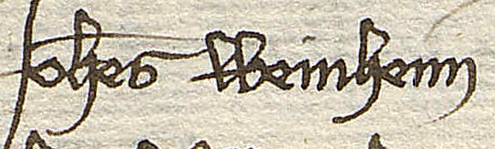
Ioh*es Weinheim
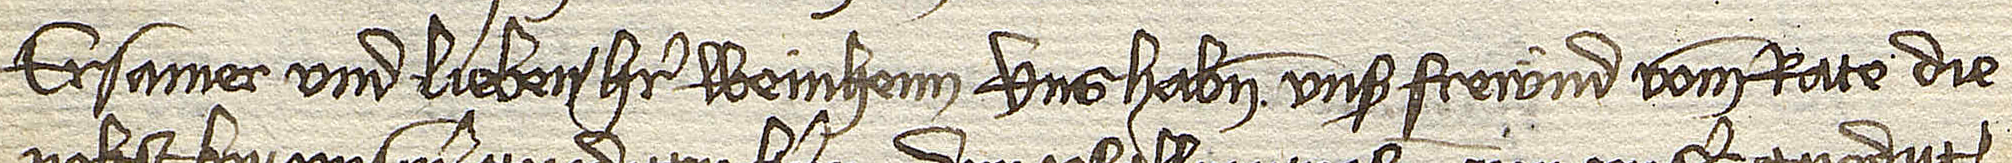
Erſamer vnd lieber hr* Weinheim Vns habn* vnſ* freẅnd vom* Rate die
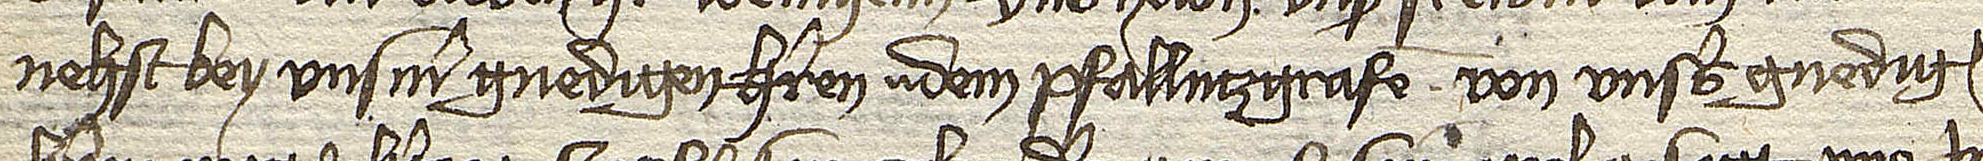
nehſt bey vnſm* gnedigen h*ren ~ dem pfallncʒgrafe* von vnſ*s gnedig*
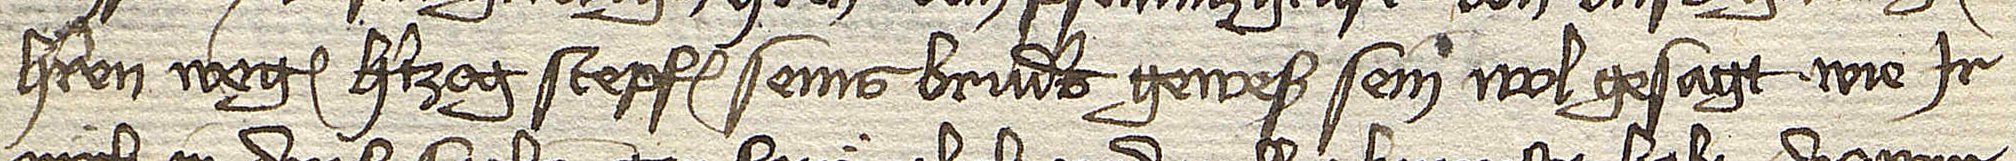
h*ren weg* h*cʒog ſtepf* ſeins brud*s geweſ* ſein wol geſagt . wie Ir
